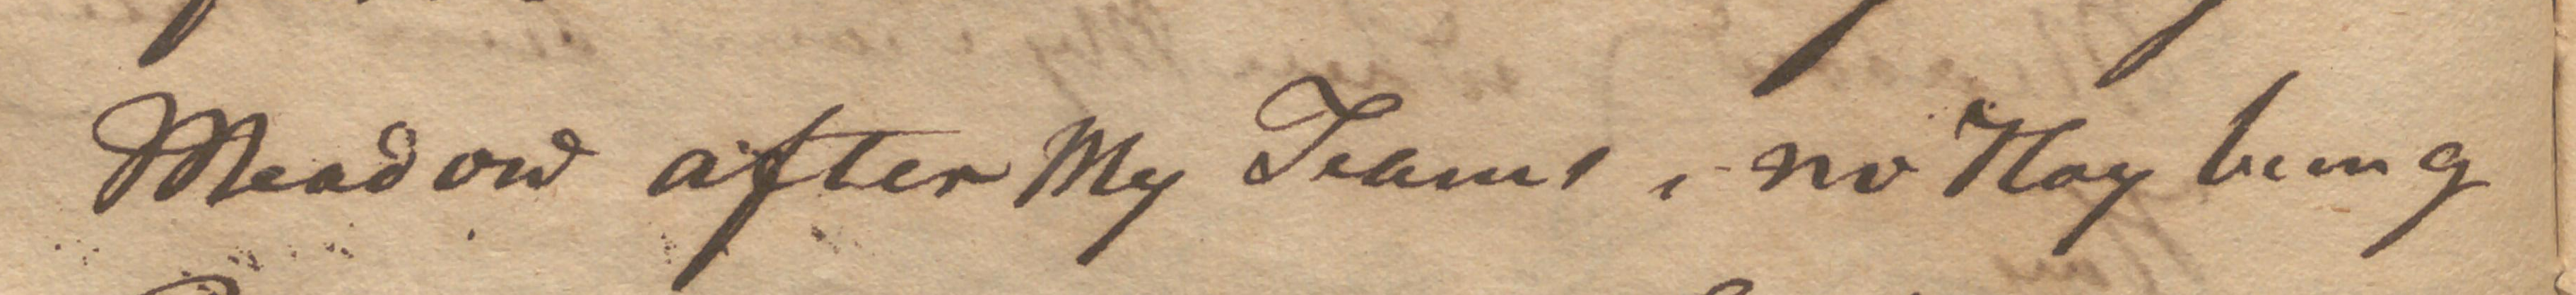Meadow after My Teams, no Hay being
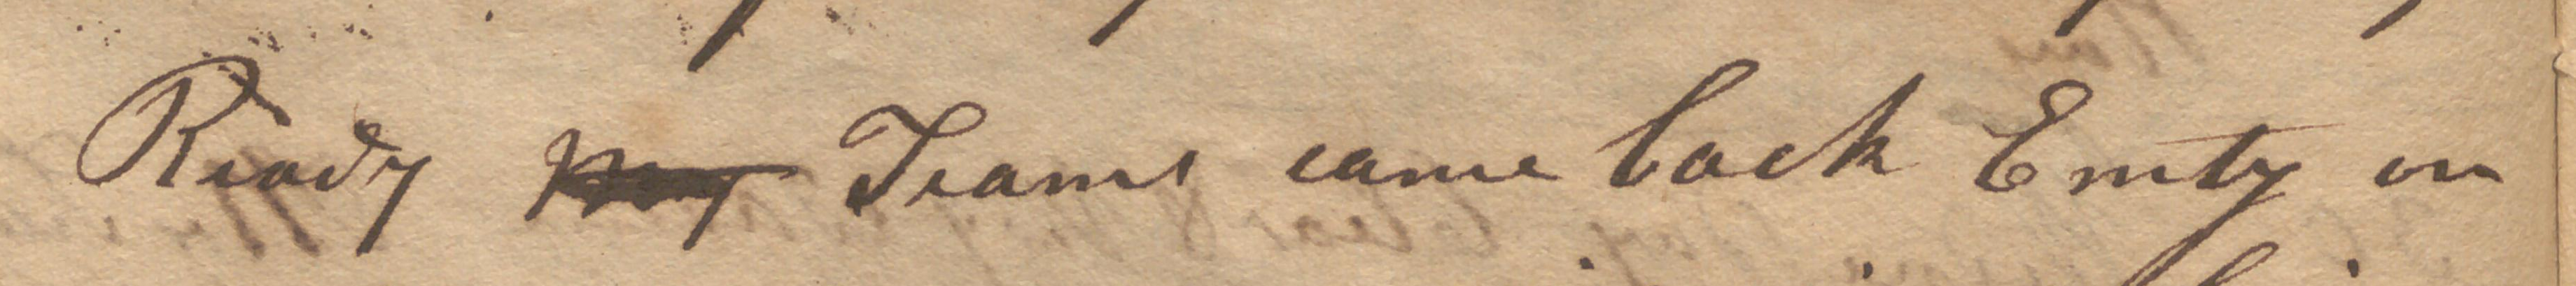Ready [my] Teams came back Emty in
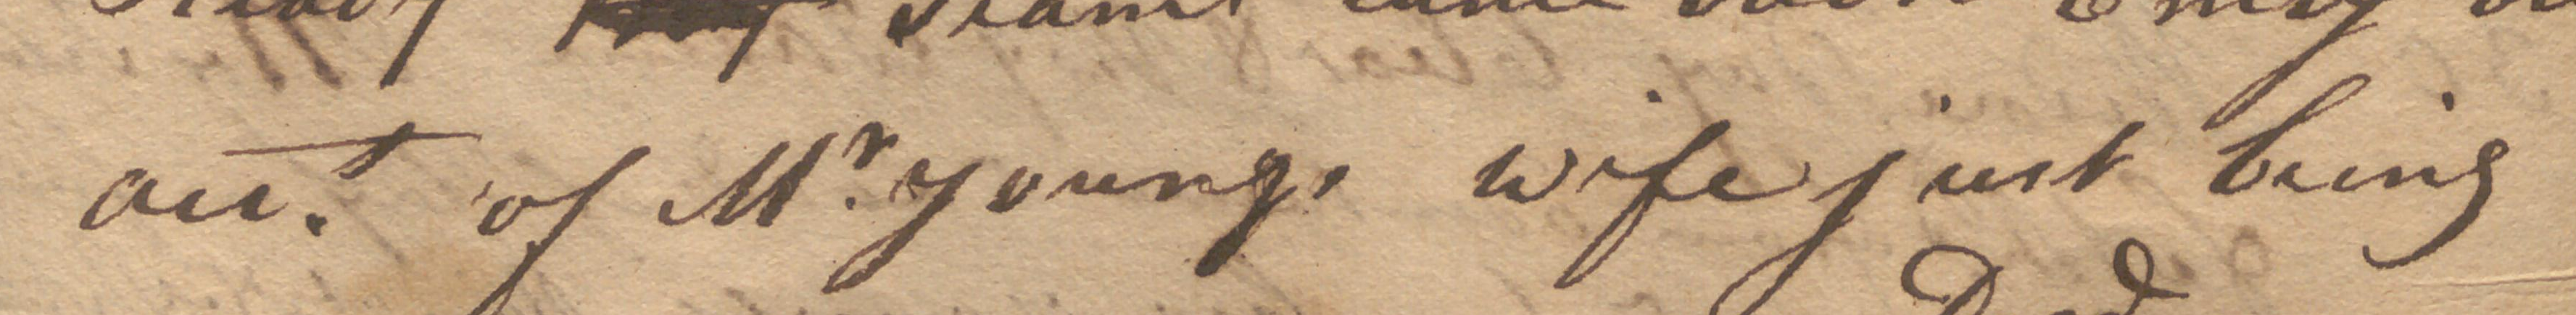acc^t. of M^r. youngs wife just being
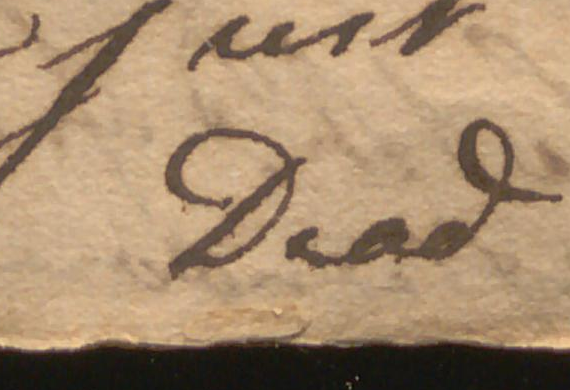Dead
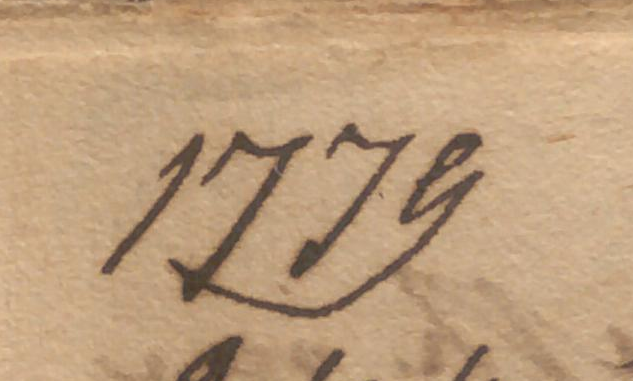1779
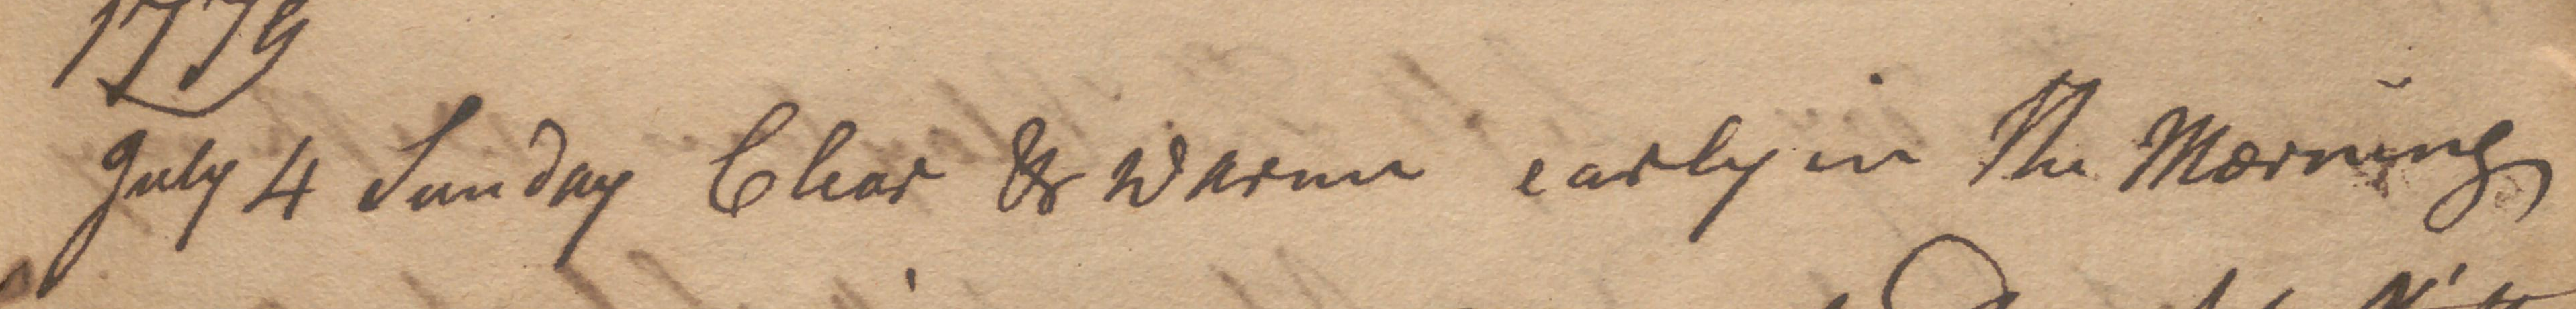July 4 Sunday Clear & warme early in the Morning
